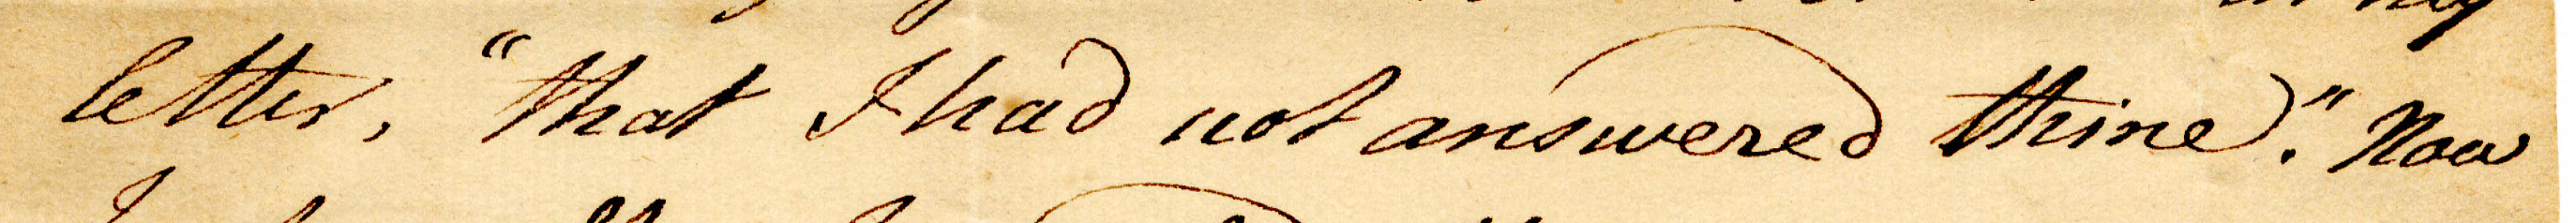letter, "that I had not answered thine." Now
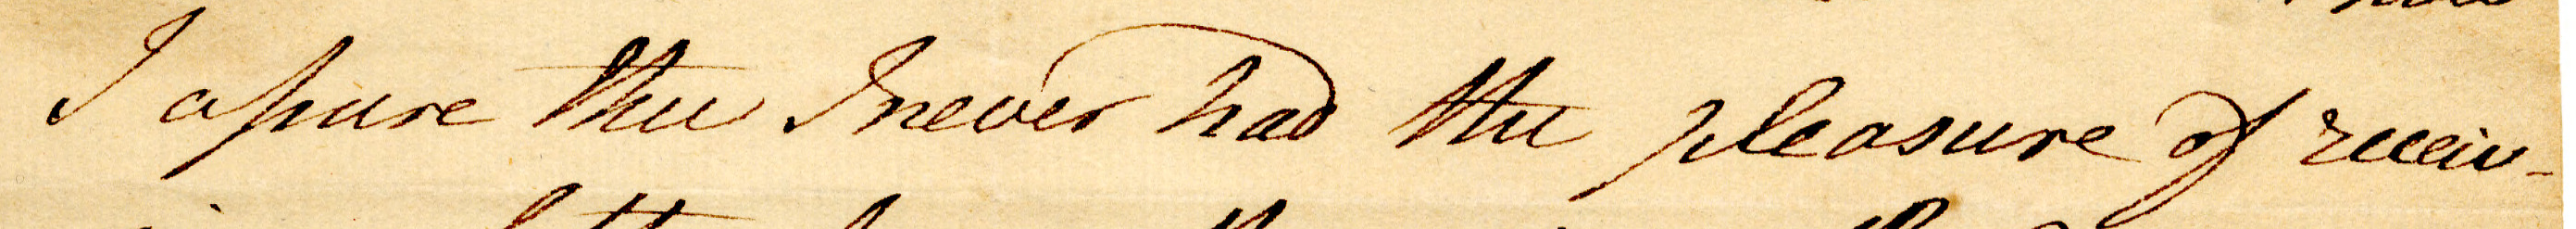I assure thee I never had the pleasure of receiv-
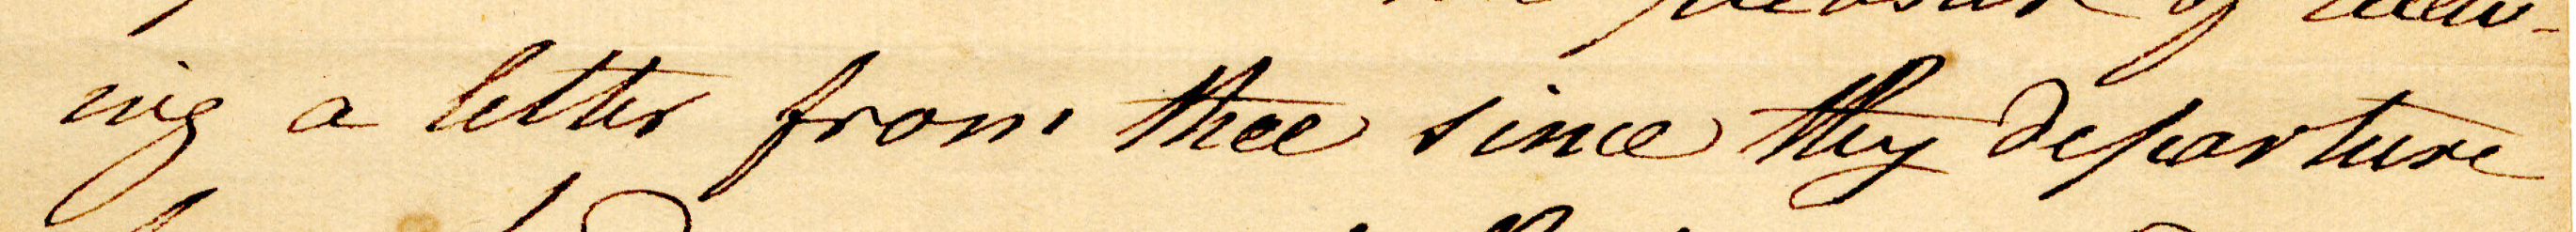ing a letter from thee since thy departure
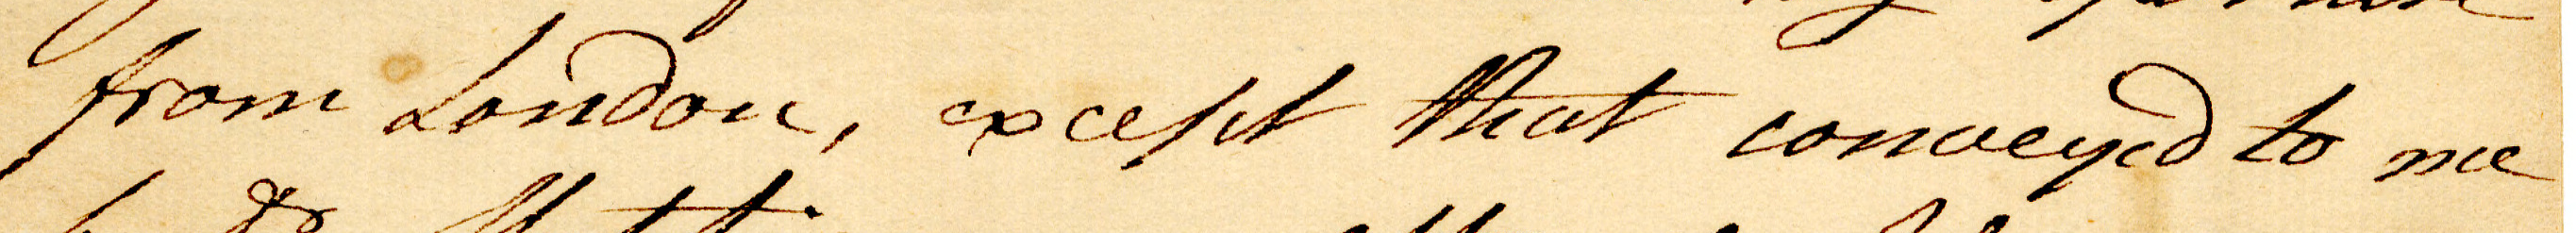from London, except that conveyed to me
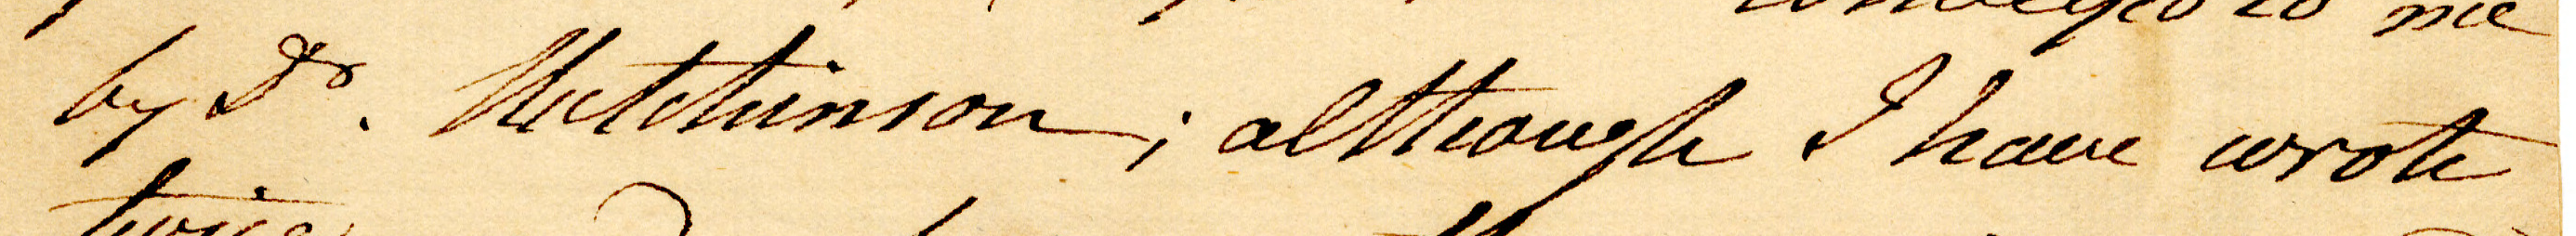by D^r. Hutchinson; although I have wrote
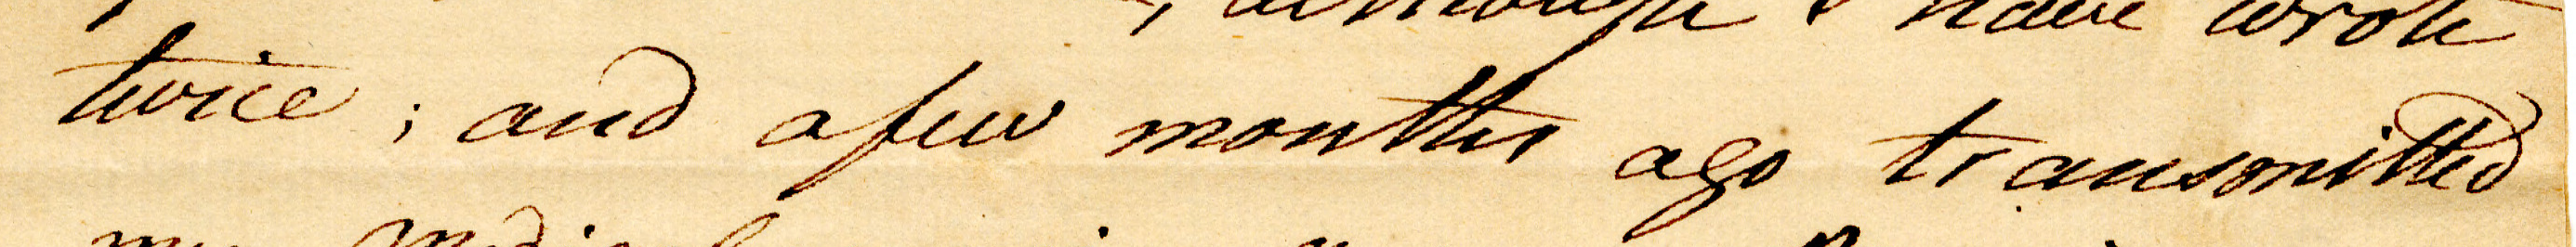twice; and a few months ago transmitted
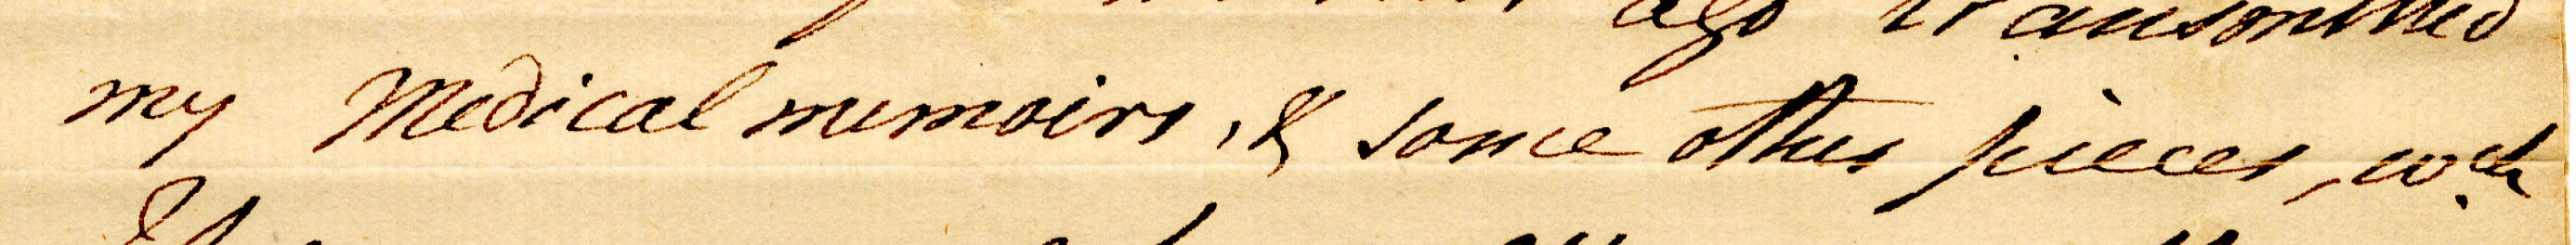my medical memoirs, & some other pieces, w^ch.
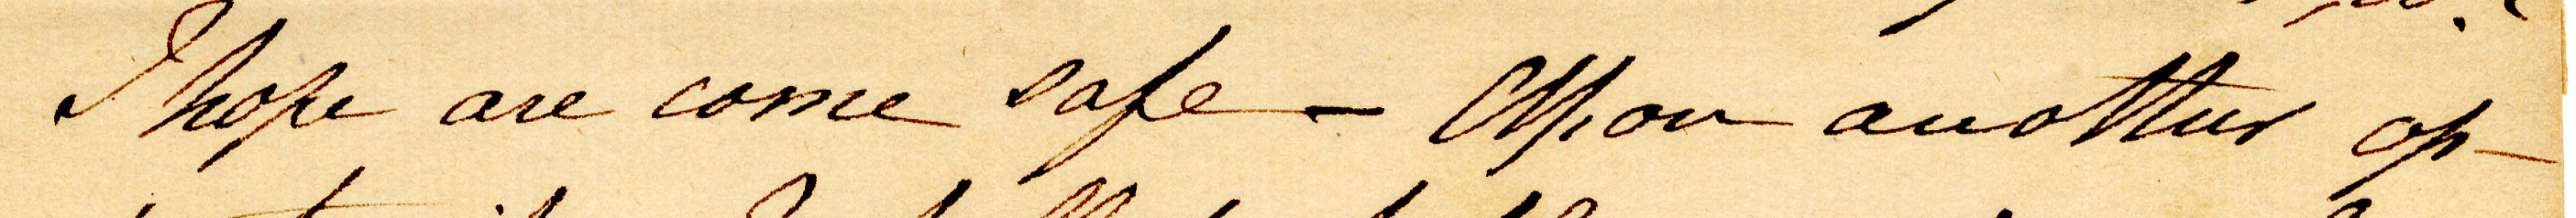I hope are come safe- Upon another op-
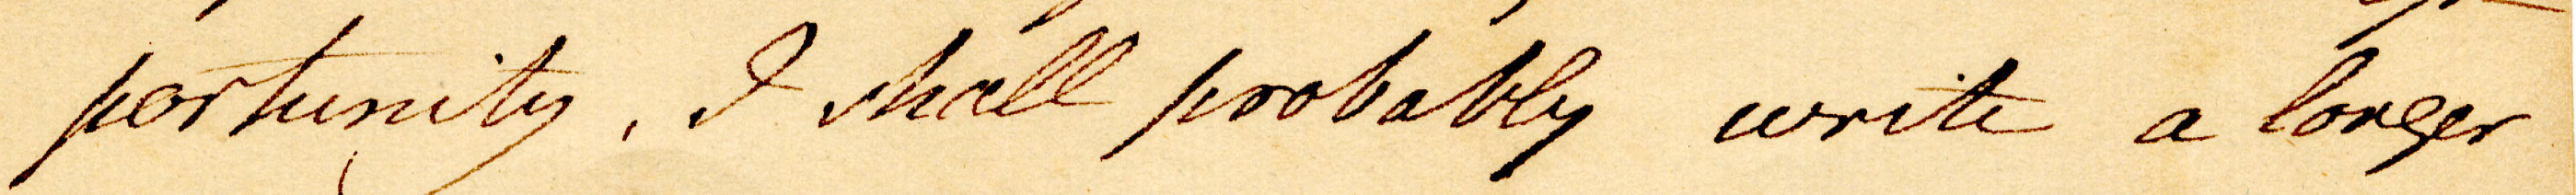portunity, I shall probably write a longer
